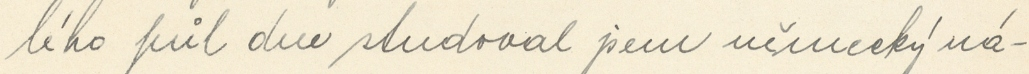lého půl dne studoval jsem německý ná-
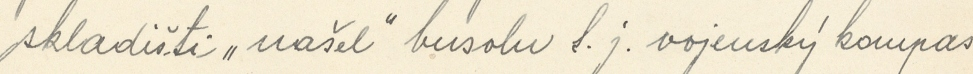skladišti „našel“ busolu t. j. vojenský kompas
